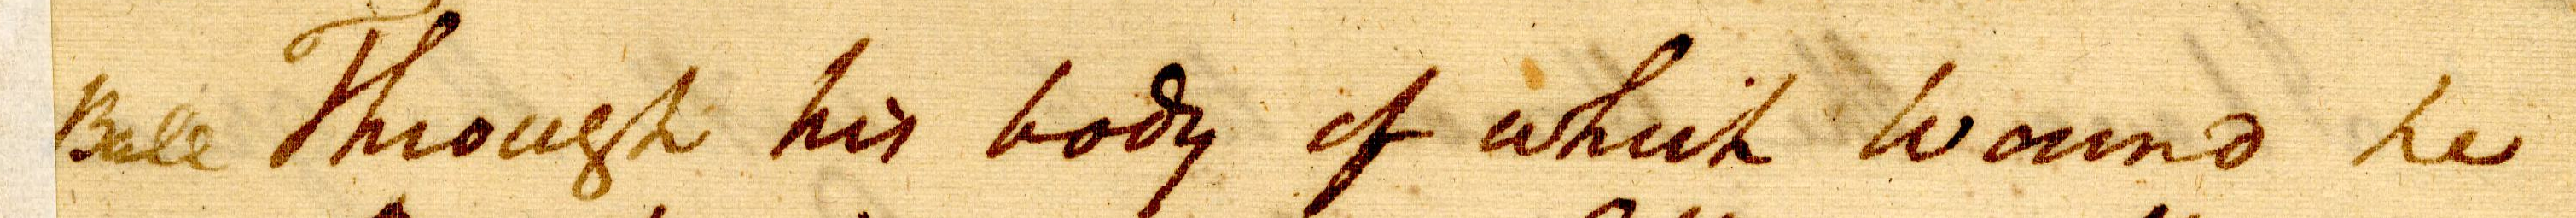Ball Through his body of which wound he
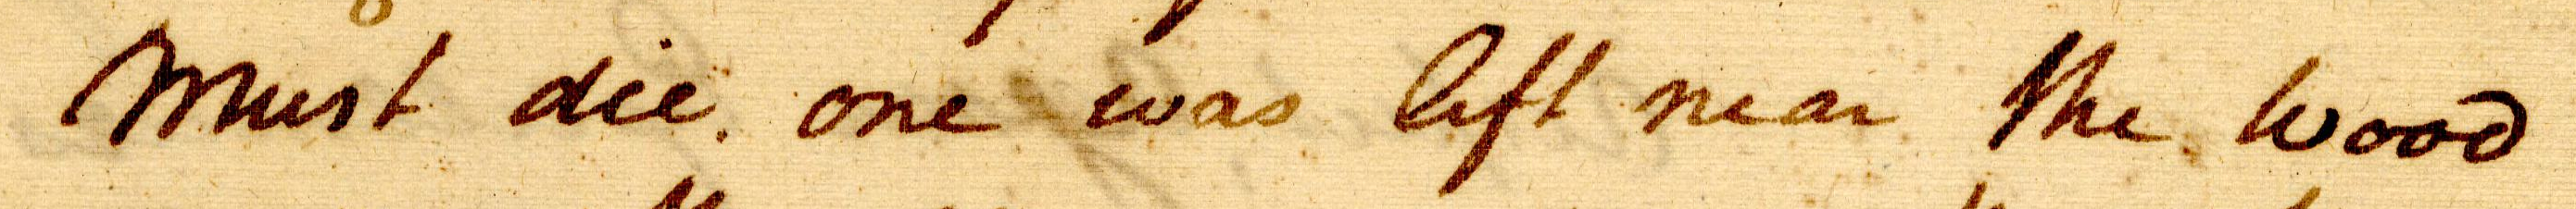must die. one was left near the wood
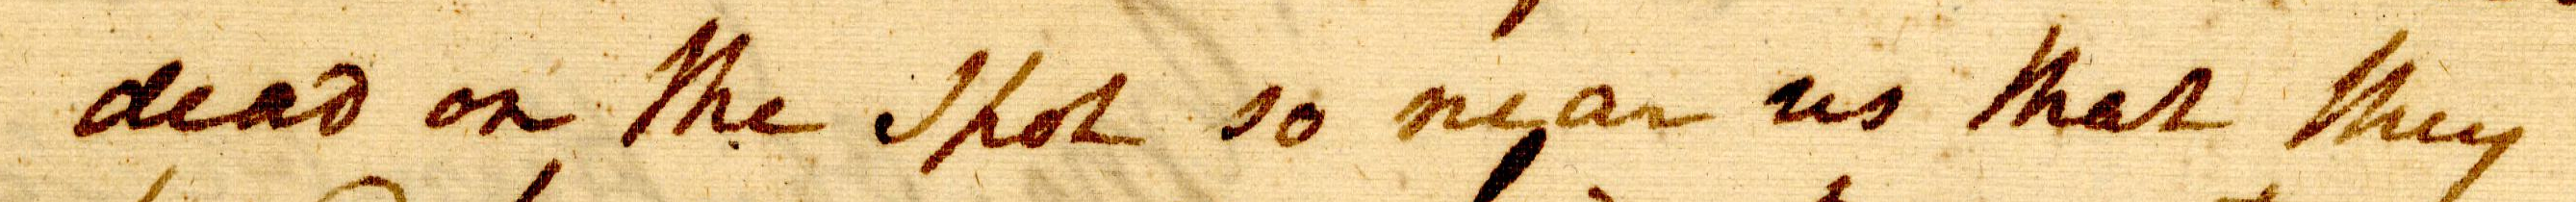dead on the spot so near us that they
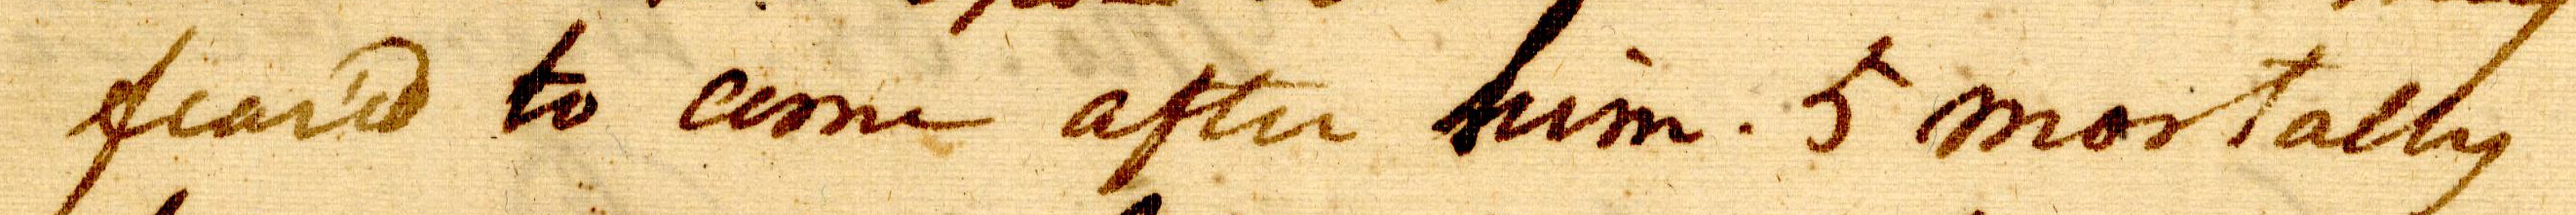fear'd to come after him. 5 mortally
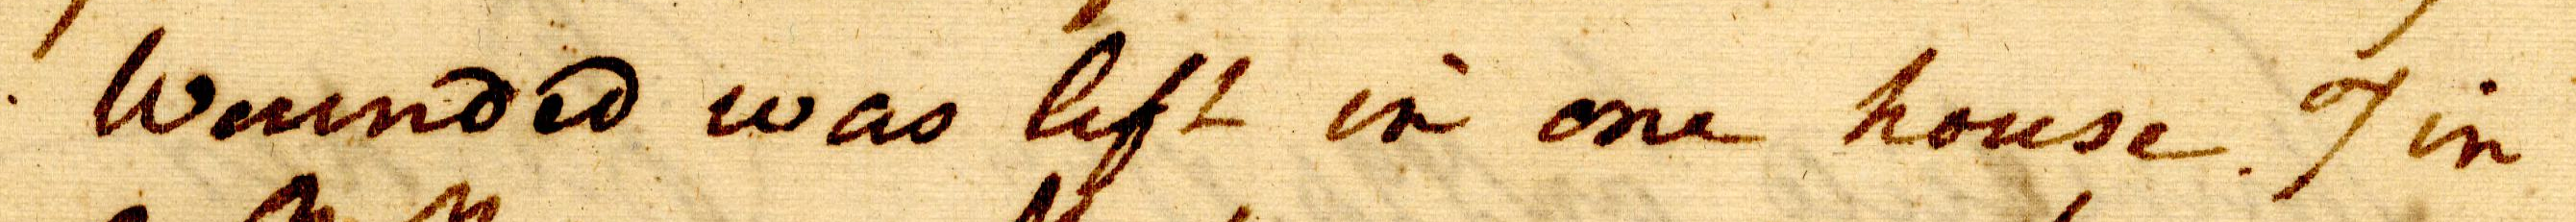wounded was left in one house 7 in
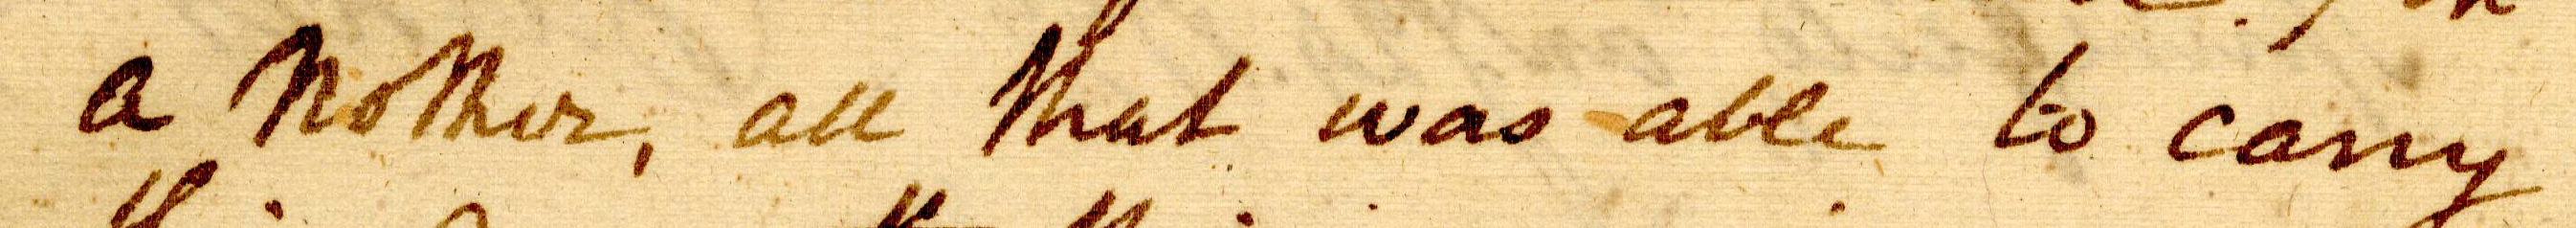a nother, all that was able to carry
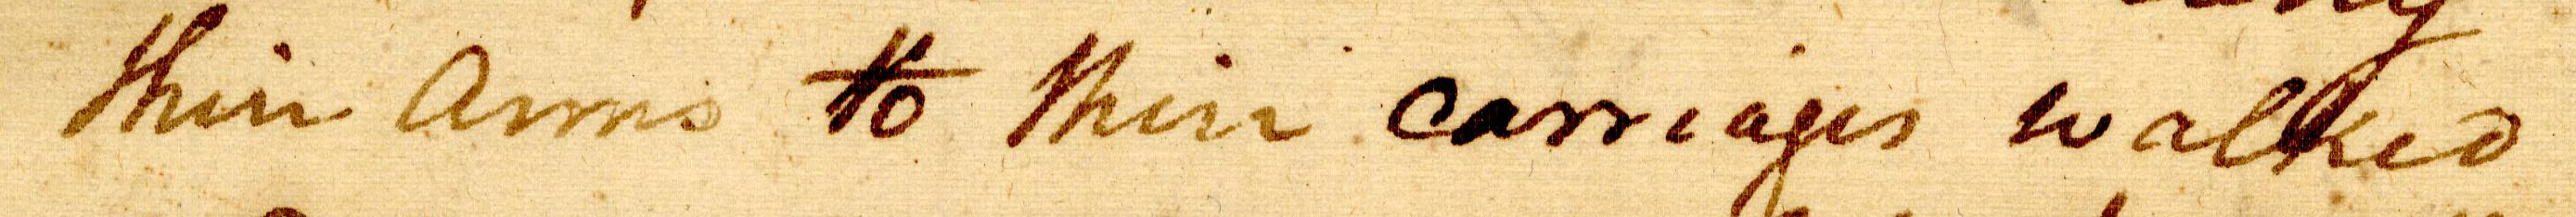their Arms to their carriages walked
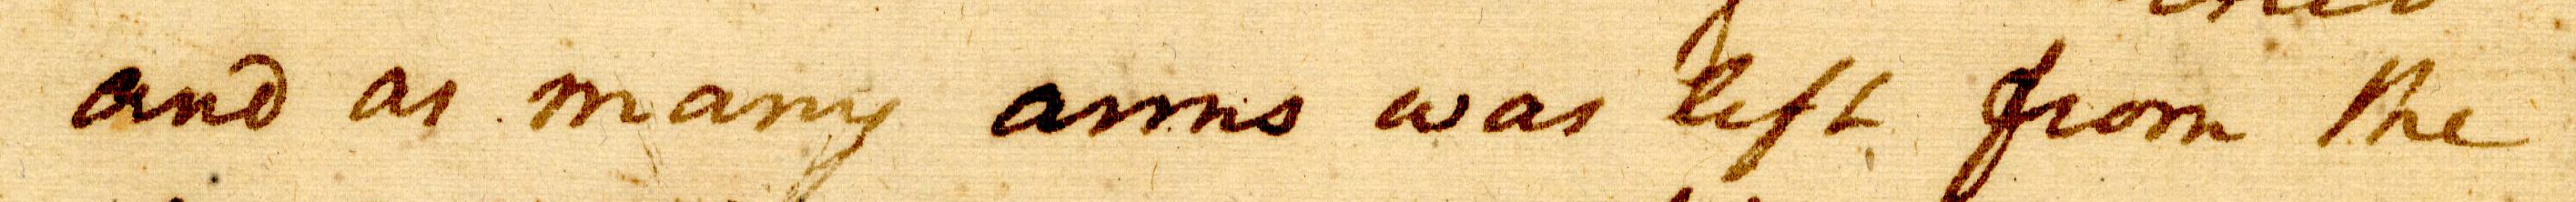and as many arms was left from the
